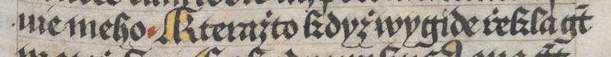nie meho.Kterażto kdyż wytgide ṙekla ḡt
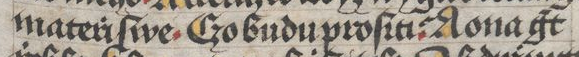mateṙi ſwe.Czo budu proſiti?A ona ḡt
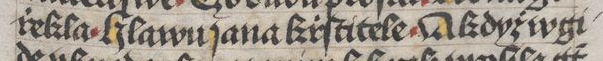ṙekla.Hlawu Iana kṙſtitele.A kdyż wgi¬
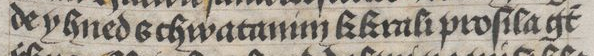de y hned w chwatanim k krali proſila ḡt
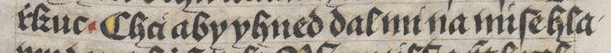ṙkuc.Chci aby y hned dal mi na miſe hla¬
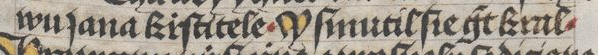wu Iana kṙẛtitele.Y ſmutil ſie ḡt kral.
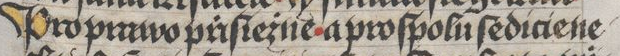Pro prawo pṙiſíeżne.a pro ſpolu ſedícíe ne¬
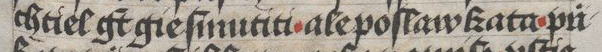chtiel ḡt gíe ſmutiti.ale poſtaw kata pṙi¬
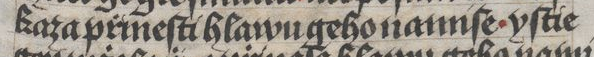kaza pṙineſti hlawu geho ne míſe.yſtie
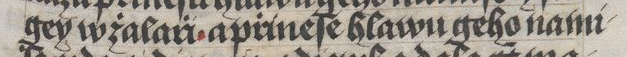hey wżalaṙi.a pṙineſe hlawu geho namí¬
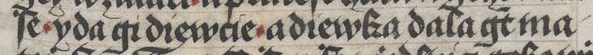ſe.yda gi diwcie.a diwka dala ḡt ma¬
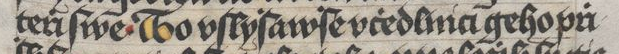teṙi ſwe.To vſlyẛawẛe vċedlnici geho pṙi¬
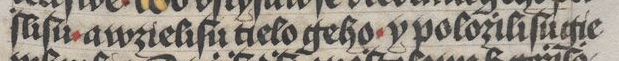ẛli ſu.a wzieli ſu tielo geho.y polożili ſu gie¬
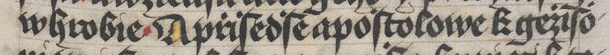whrobie. A pṙiẛedẛe apoẛtolowé k geżíẛo¬
